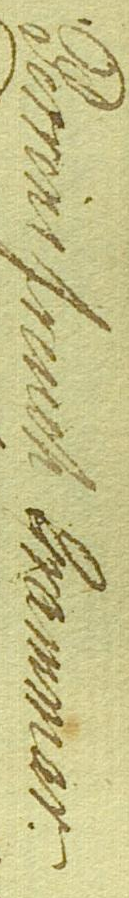Perron's French Grammar.
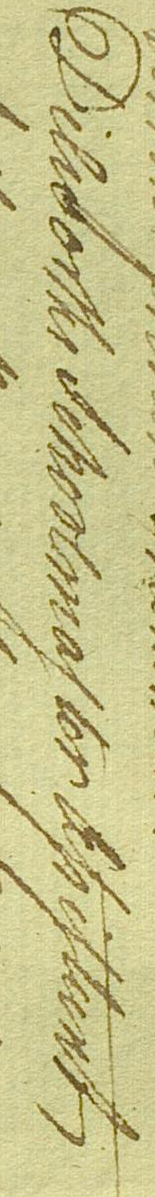Dilsworths Schoolmaster Assistants
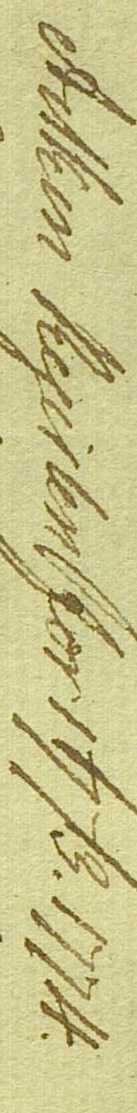Aiken Register for 1773. 1774.
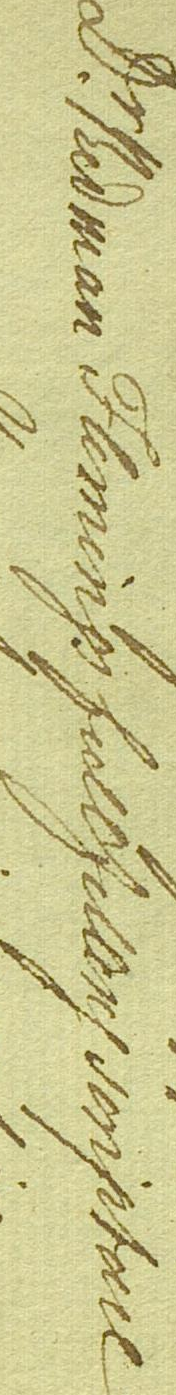D^r. Redman Flemings fullfilling scripture
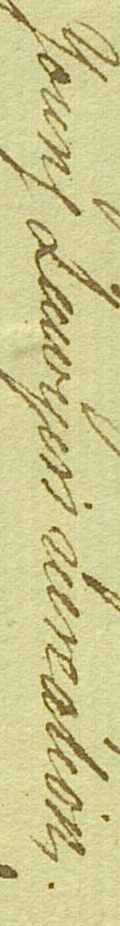Young Lawyer's recreation.
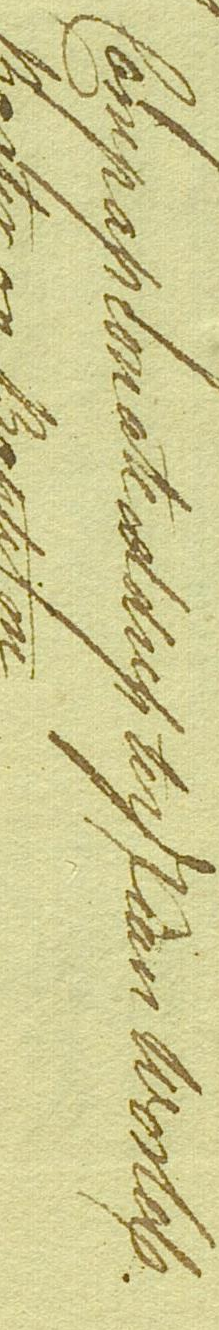Compassionate address for y^e Pious Worlds.
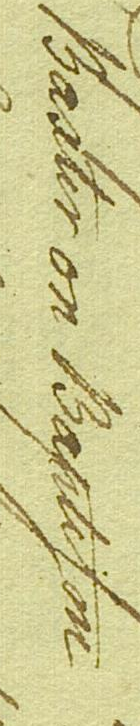Baxter on Baptism
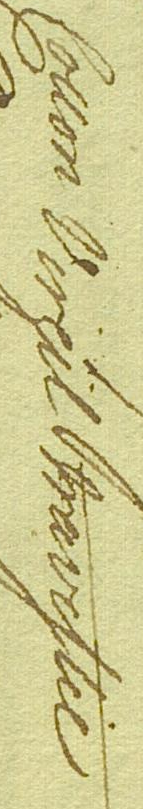Cotton Virgil travestie
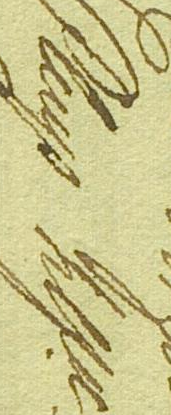Plays [____]
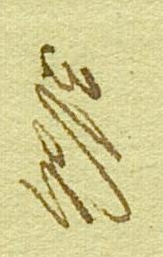3Vols
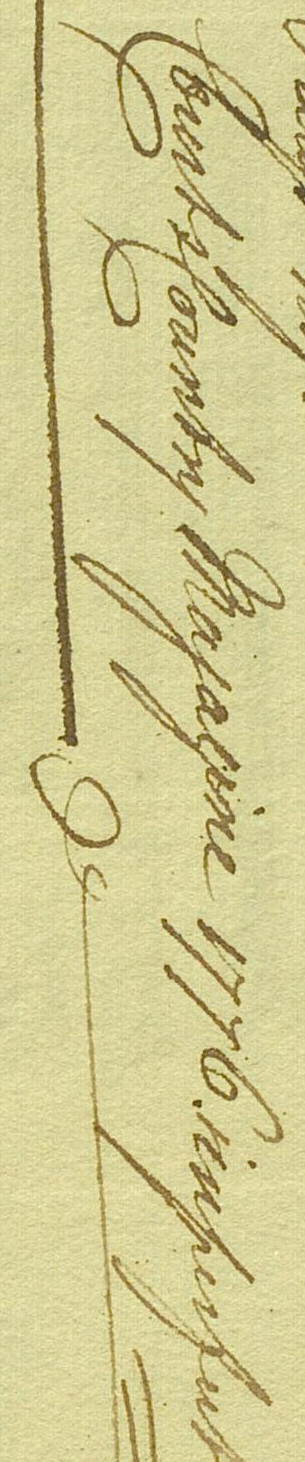Courts Country Magazine 1776. imperfect
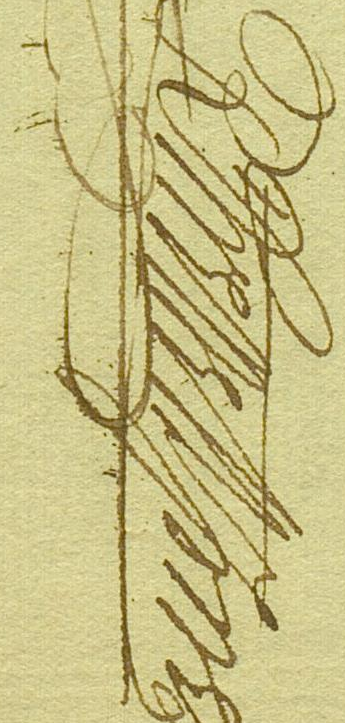R Strettel Jones.
